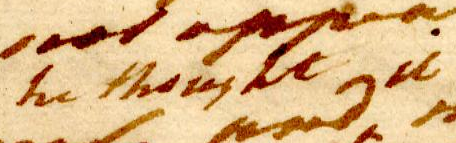he thought it
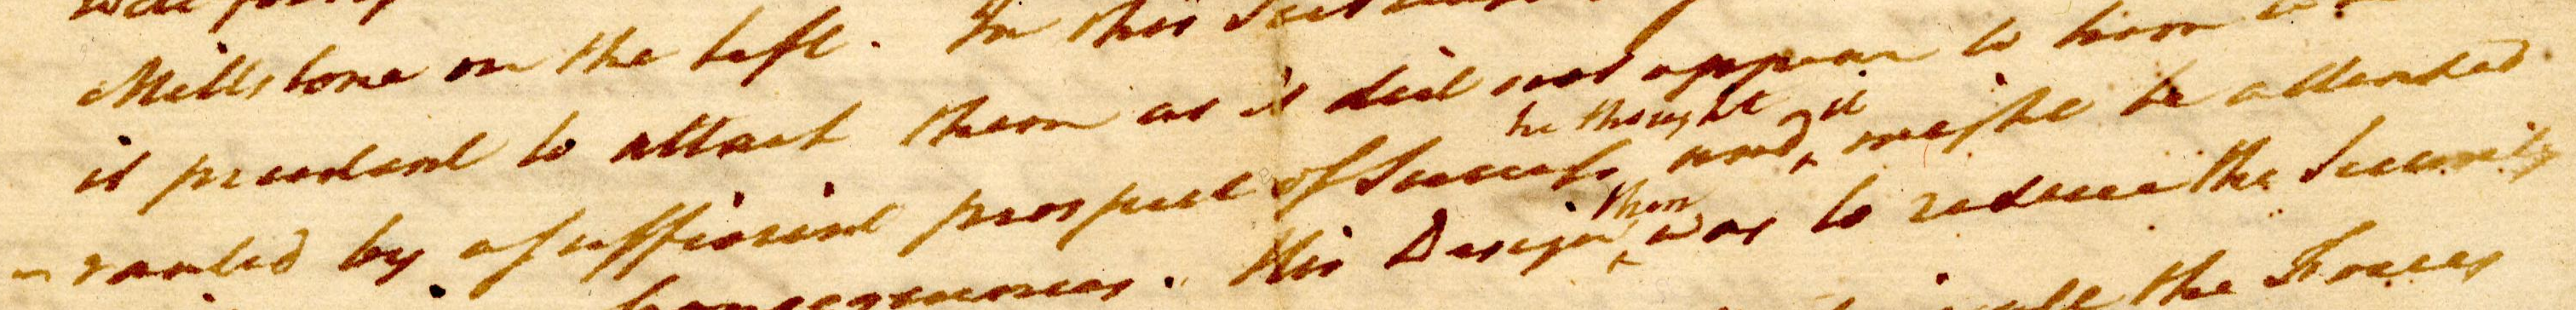-ranted by sufficient prospect of such and ^ might be attended
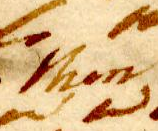then
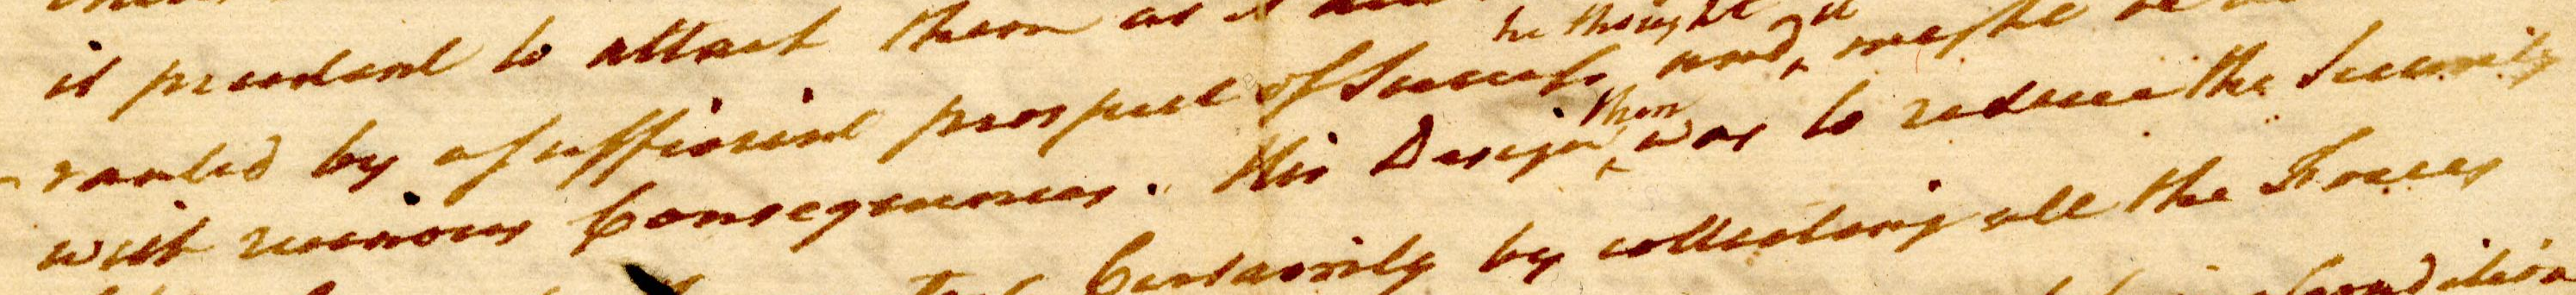with ruinous Consequences. His Design ^ was to reduce the security
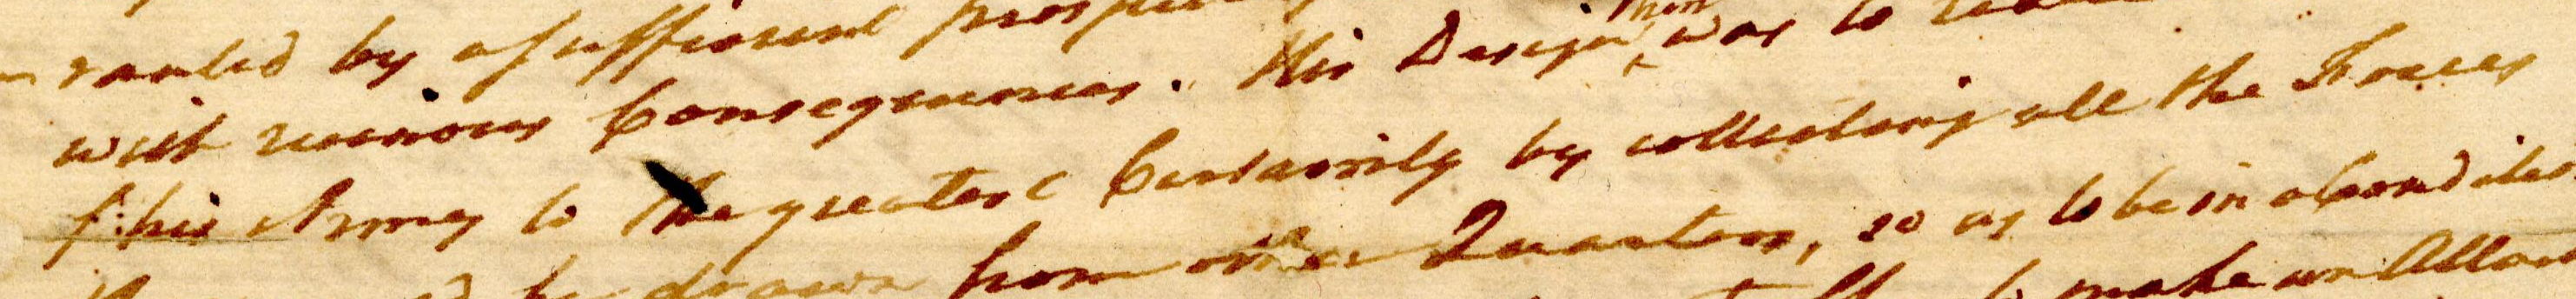of his Army to the greater Certainty by collecting all the Forces
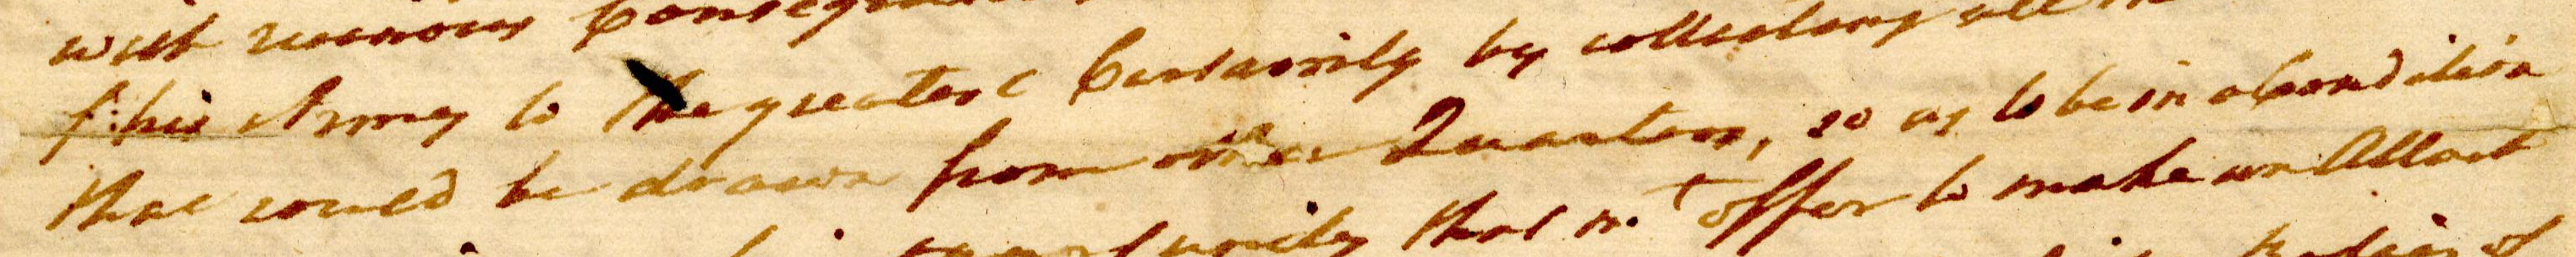thee could be drawn from other Quarters, so as to be in a Condition
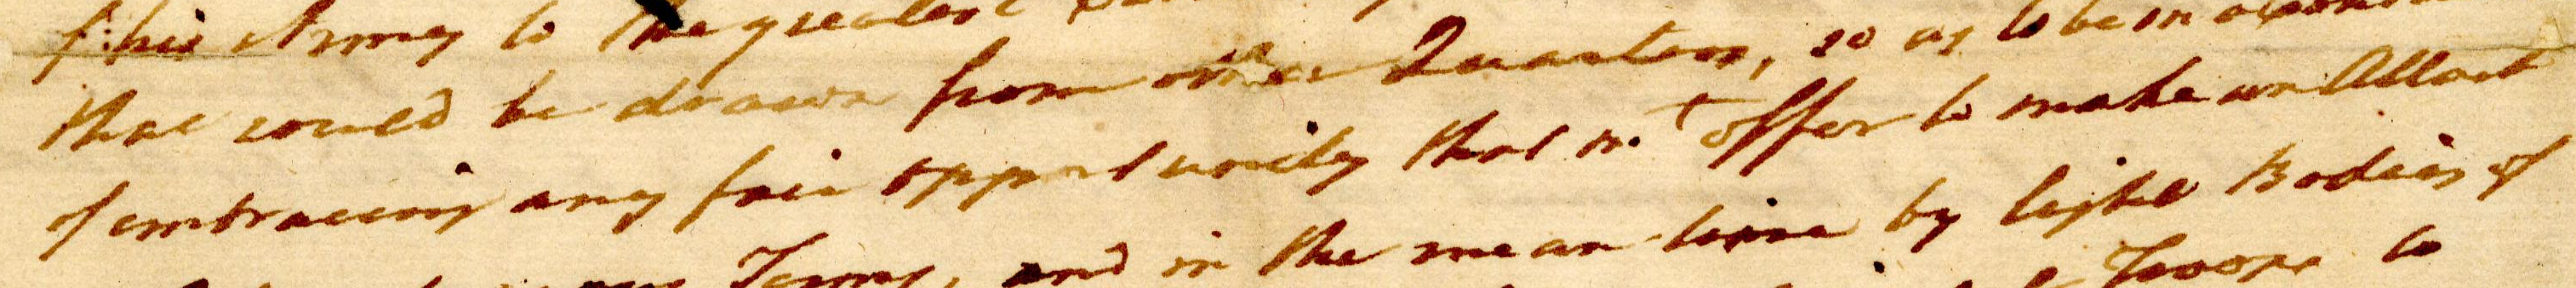of embracing any fair opportunity that m^t. offer to make an Attack
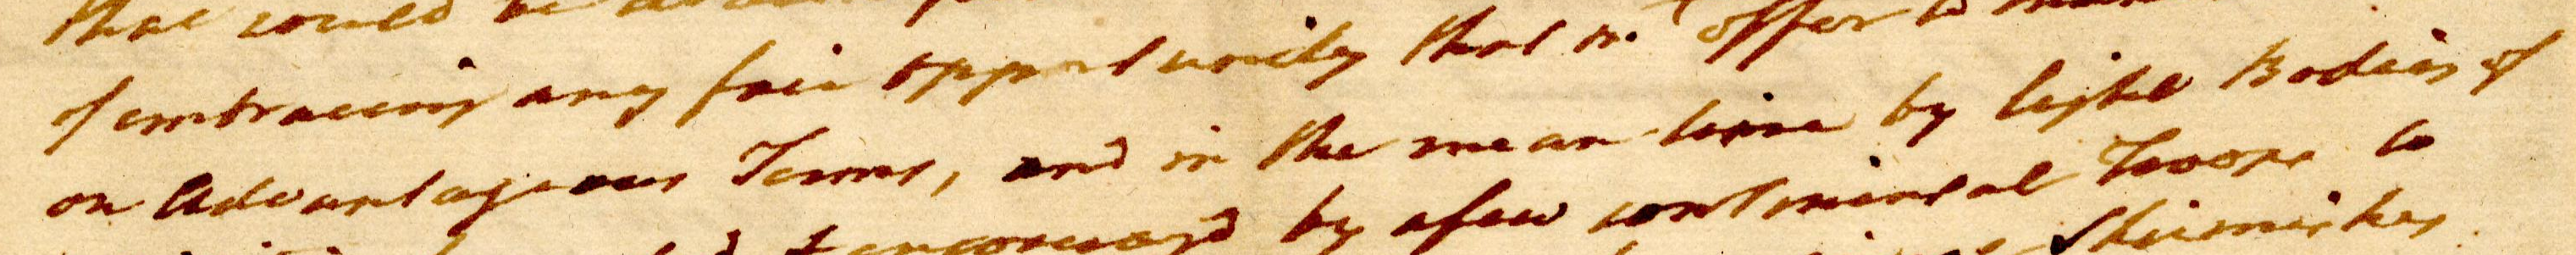on Advantageous Terms, and in the mean time by light Bodies of
